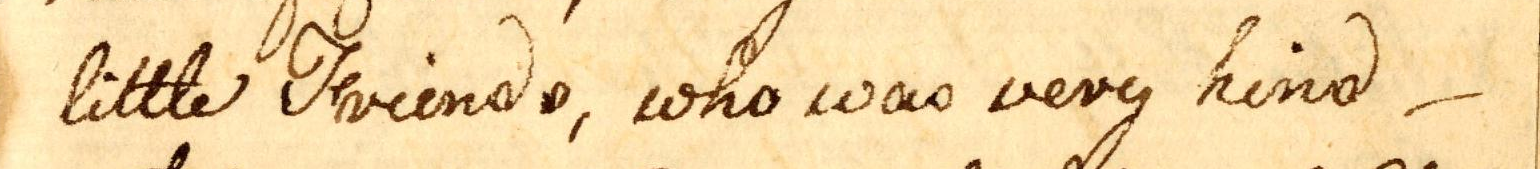little Friends, who was very kind-
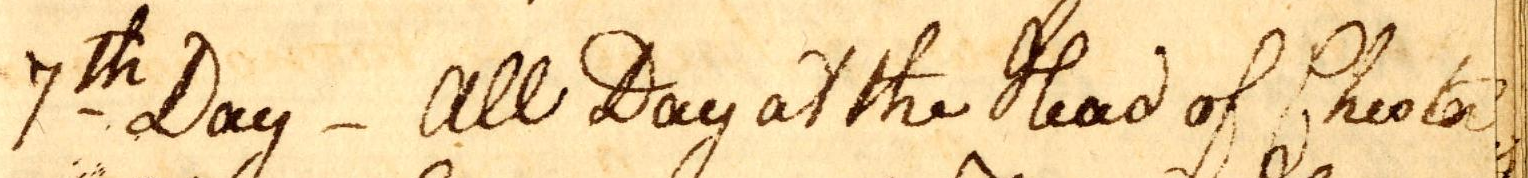7^th Day- All Day at the Head of Chester
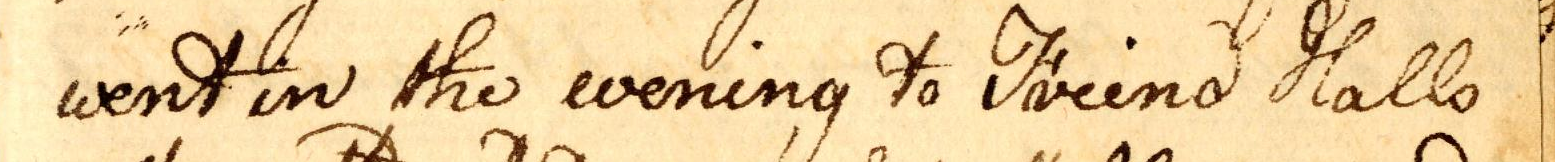went in the evening to Friend Halls
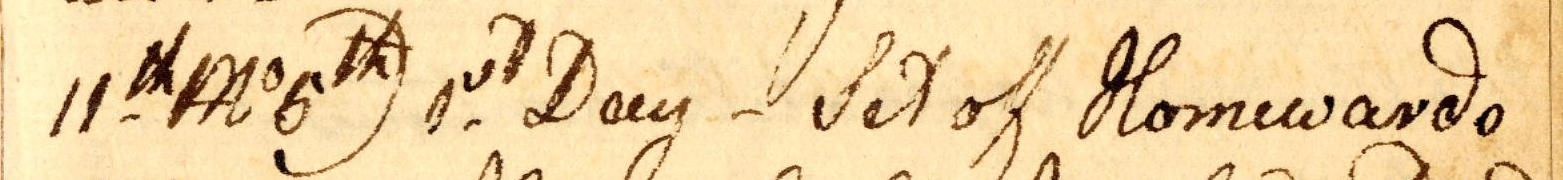11^th M^o 5^th) 1^st Day- Set off Homewards
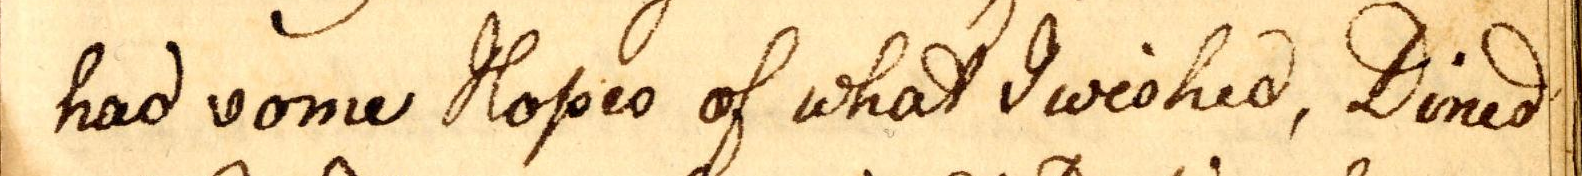had some Hopes of what I wished, Dined
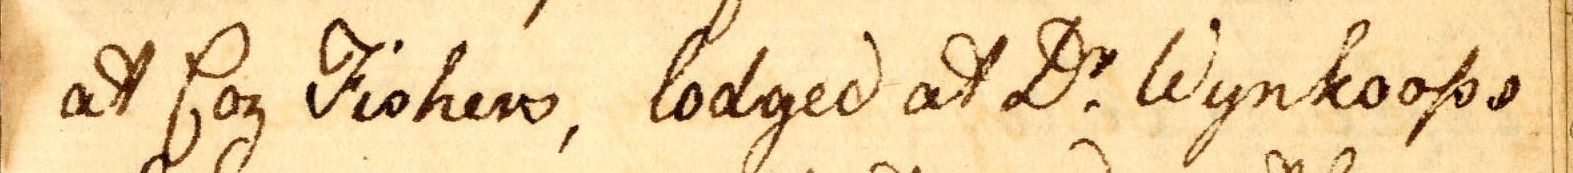at Coz Fishers, lodged at D^r. Wynkoops
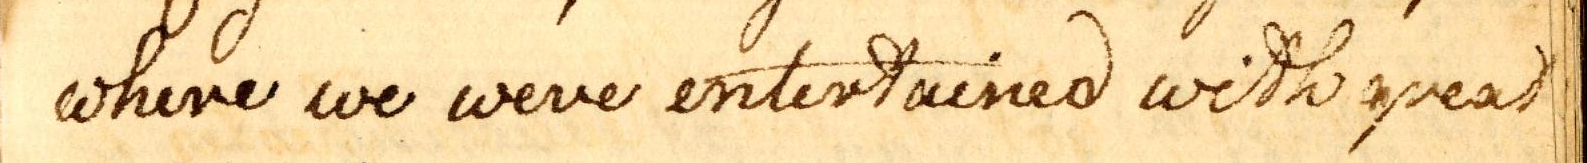where we were entertained with great
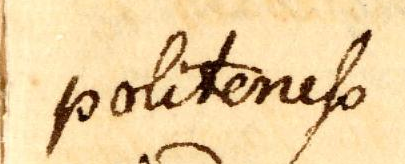politeness
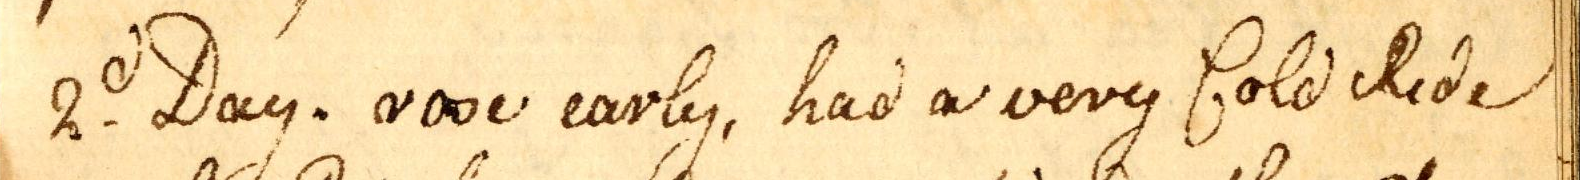2^d Day. rose early, had a very Cold Ride
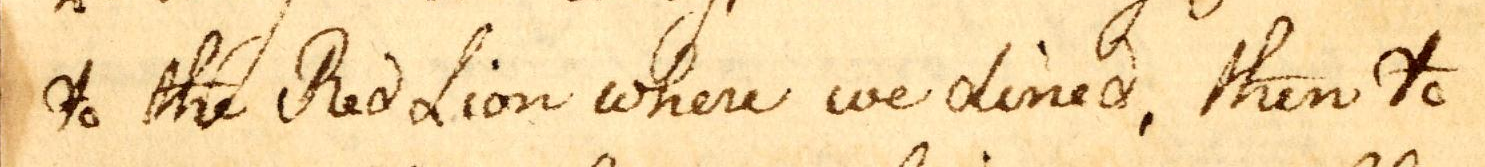to the Red Lion where we dined, then to
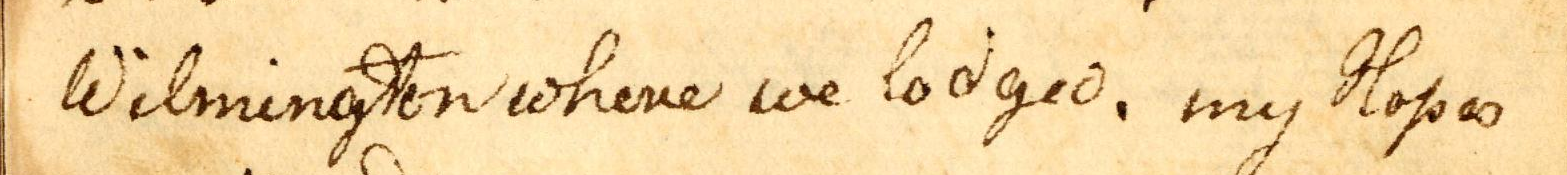Wilmington where we lodged, my Hopes
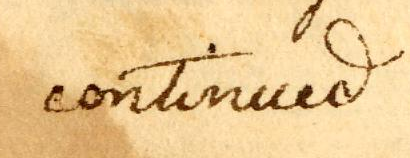continued
